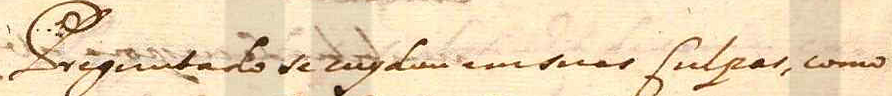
Preguntado se cuydou em suas Culpas, como
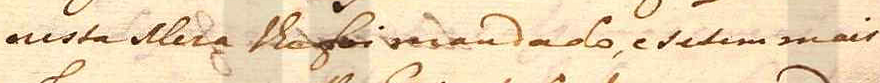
nesta Meza lhe foi mandado, e se tem mais
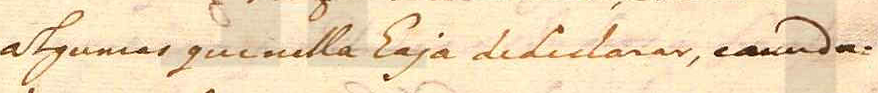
algumas que nella haja de declarar, e a uerda
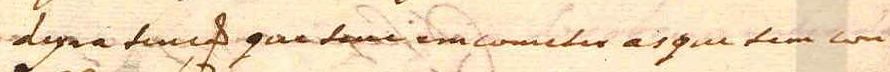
deyra tençaõ que teue em cometer as que tem con
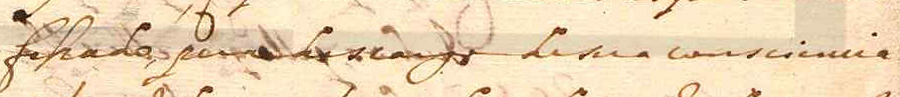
fessado, pera descargo de sua consciencia
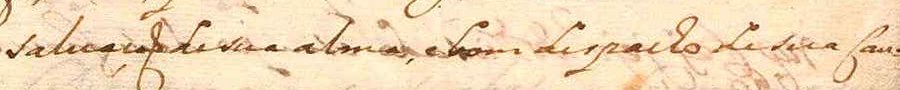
saluaçaõ de sua alma, e bom despacho de sua Cau
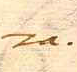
za.
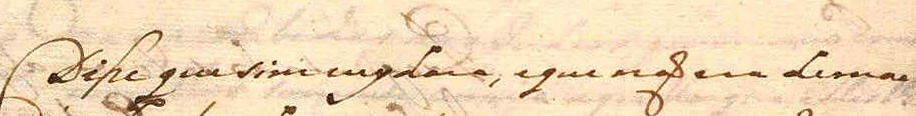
Disse que sim cuydara, e que naõ era dema
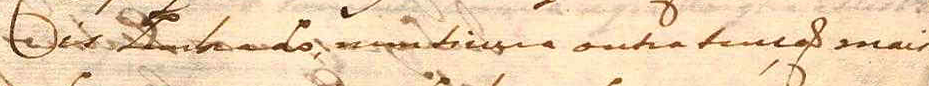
is lembrado, nem tiuera outra tençaõ mais
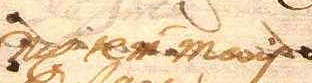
naõ tem mais
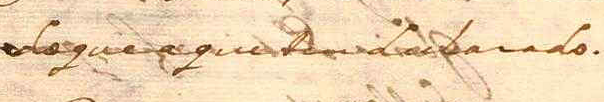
do que a que tem declarado.
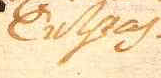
Culpas
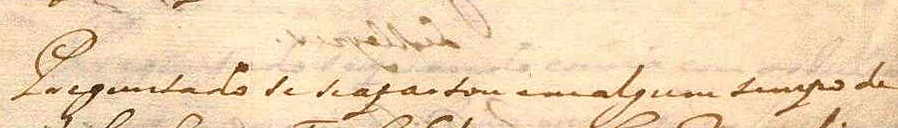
Preguntado se se apartou em algum tempo de
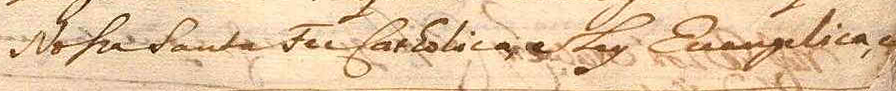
Nossa Santa Fee Catholica, e Ley Euangelica, e
